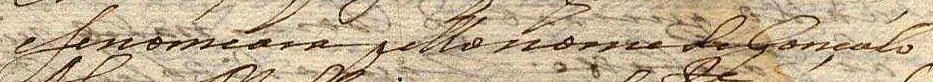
e se nomeara pello nome de Gonçalo
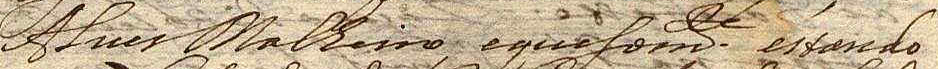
Alues Malheiro, e que som.te estando
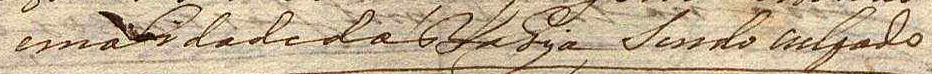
em a Cidade da Bahya, Sendo culpado
